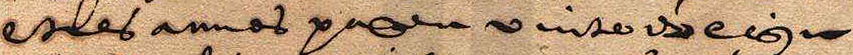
e tres annos pagou vinto rs̄ e esjn
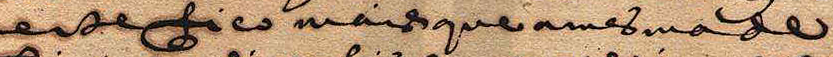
sertefico mais que a mesma de
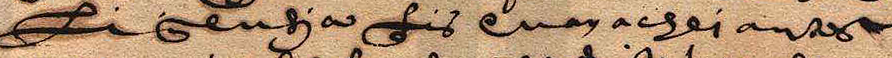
Ligensja fis e naõ achei autos
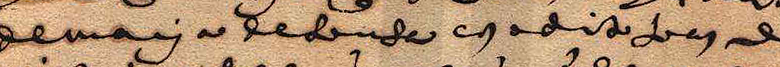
de marja de sousa cō o dito Joaõs de
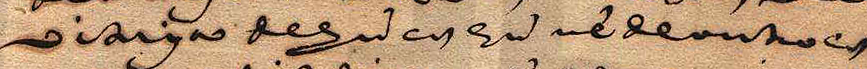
vitorya de hū cō hū nē de outro cō
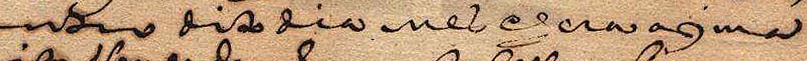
outro dito dia mes e hera asjma
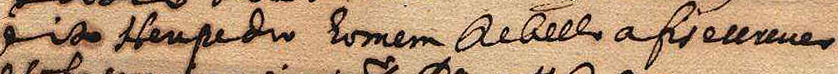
dito Heu pedro homem Rebello a fis escreuer
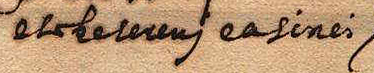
e sobescreuj e asinei
